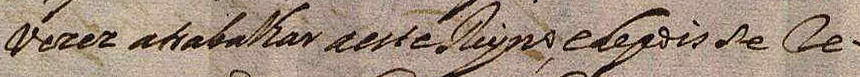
vezez a trabalhar a este Reyno, e depois se Re
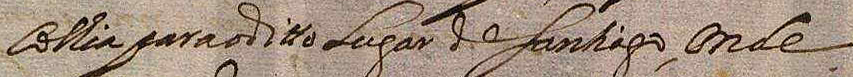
colhia para o ditto Lugar de Santiago, onde
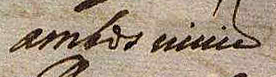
ambos uiuiaõ.
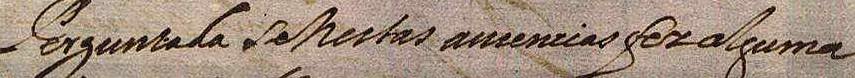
Perguntada se nestas ausencias fez alguma
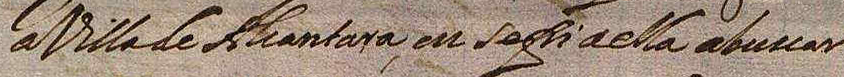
a Villa de Alcantara, ou se foi a ella a buscar
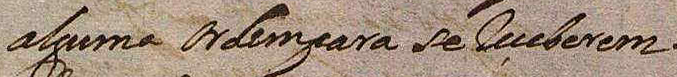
alguma ordem para se Reçeberem?
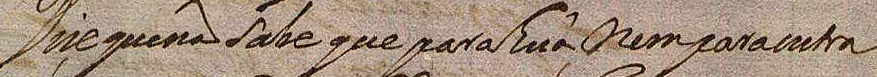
Diçe que naõ sabe que para huā, nem para outra
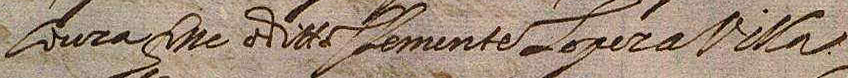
couza fosse o ditto Clemente Lopez a Villa
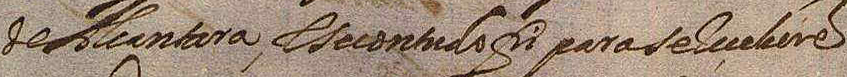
de Alcantara, E se contudo foi para se Reçeberē
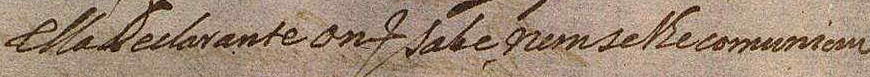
ella Declarante o nõ sabe, nem se lhe comunicou
